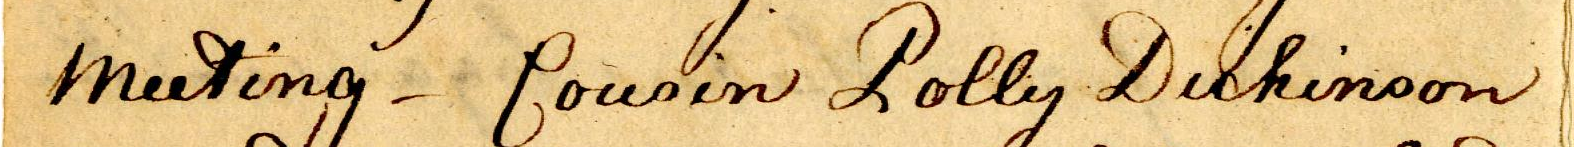Meeting- Cousin Polly Dickinson
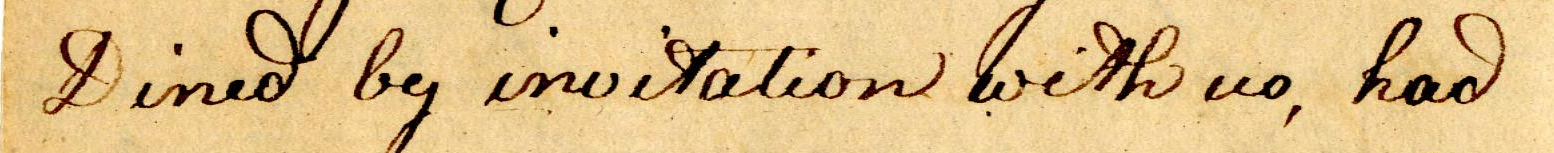Dined by invitation with us, had
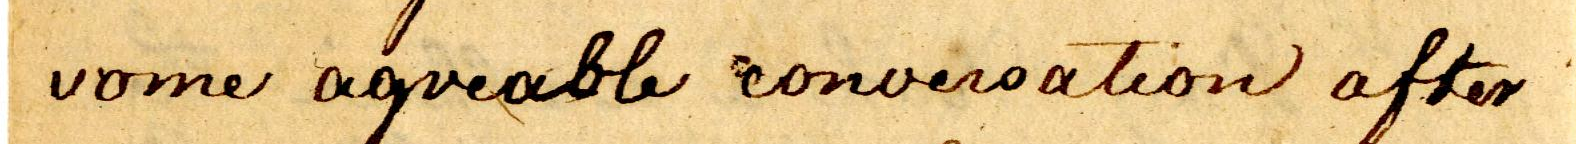some agreable conversation after
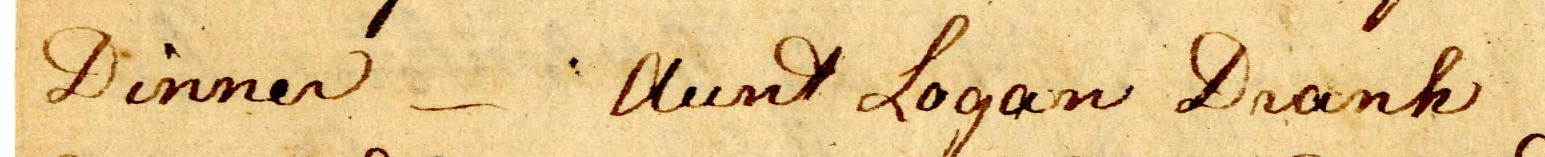Dinner- Aunt Logan Drank
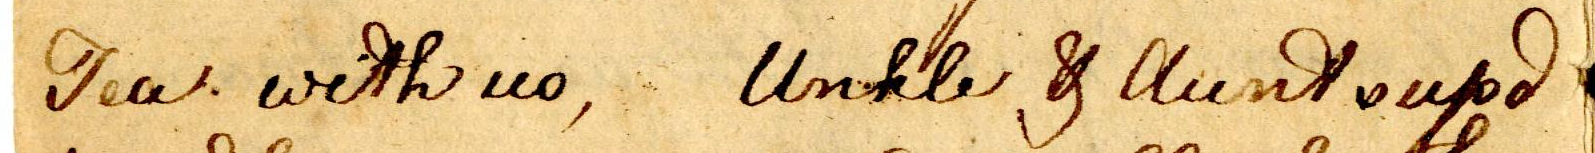Tea with us, Unkle & Aunt supd
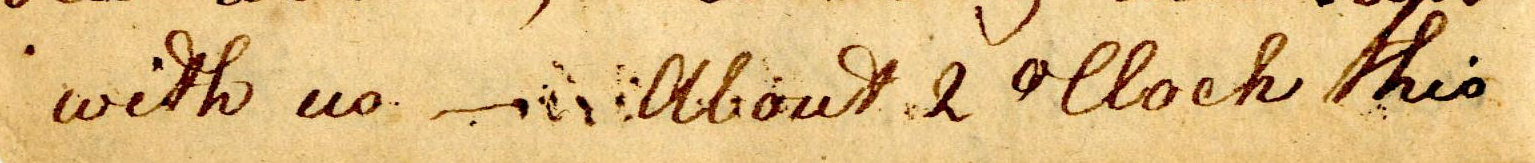with us- About 2 ^oClock this
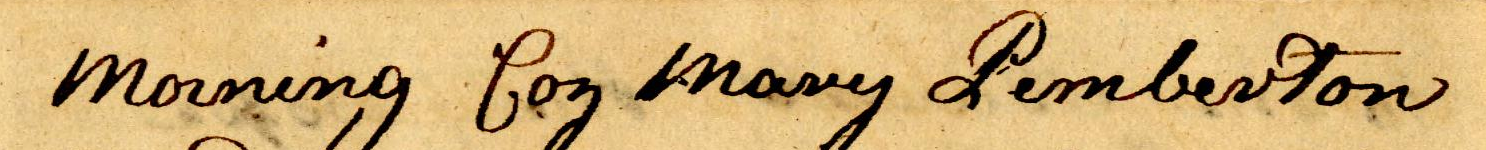Morning Coz Mary Pemberton
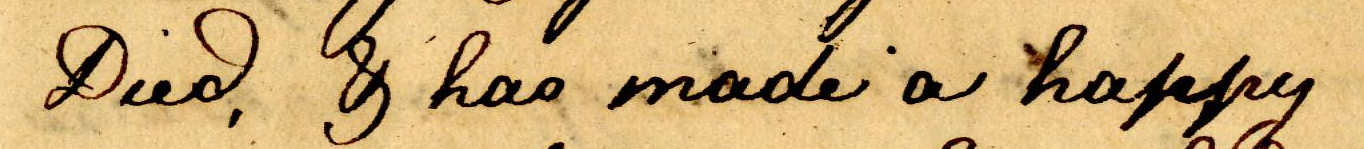Died, & has made a happy
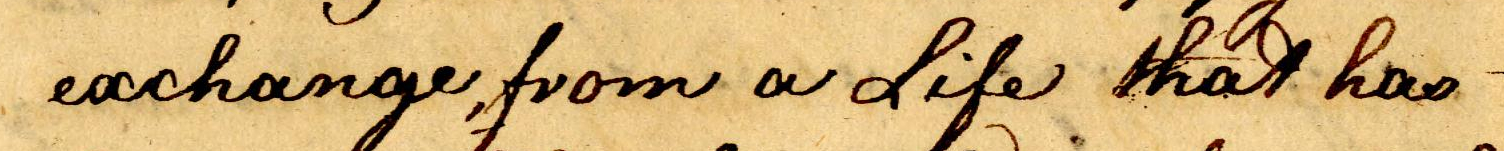exchange, from a Life that has
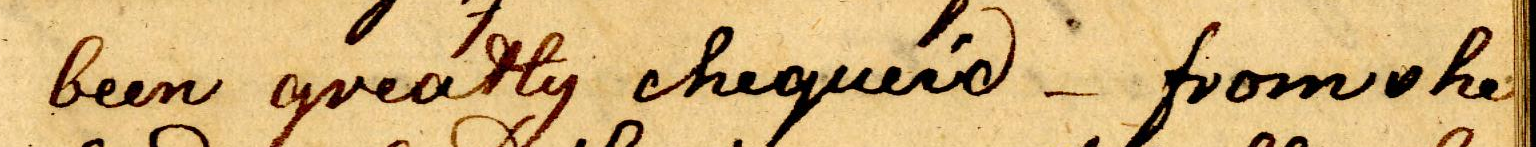been greatly chequer'd- from she
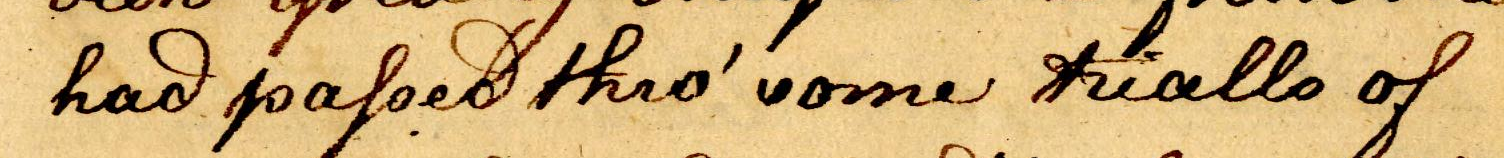had passed thro' some trialls of
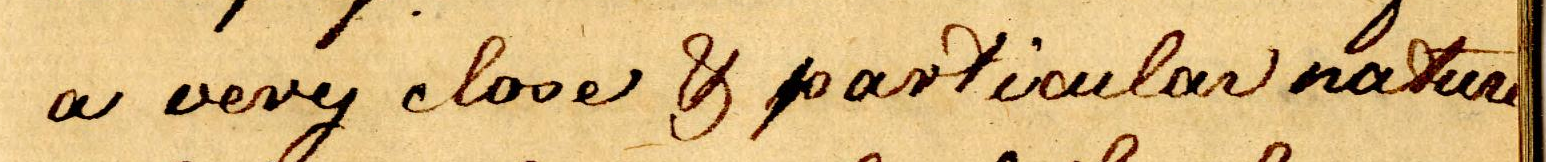a very close & particular nature
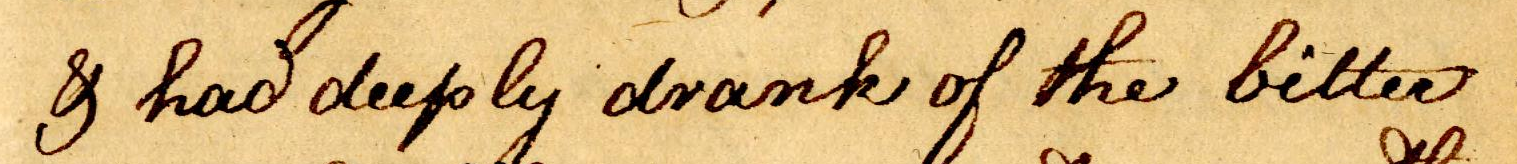& had deeply drank of the bitter
